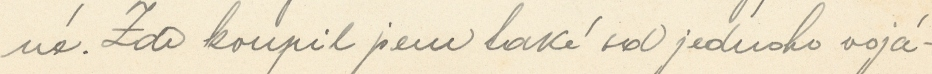né. Zde koupil jsem také od jednoho vojá-
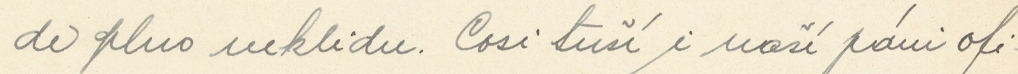de plno neklidu. Cosi tuší i naší páni ofi-
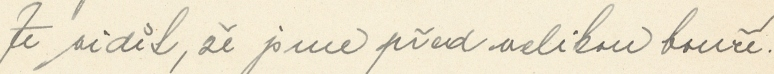Je vidět, že jsme před velikou bouří.
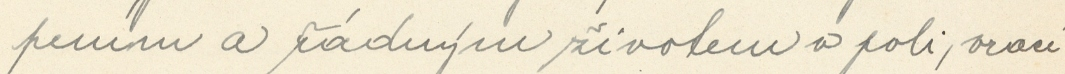pením a řádným životem v poli, vrací
